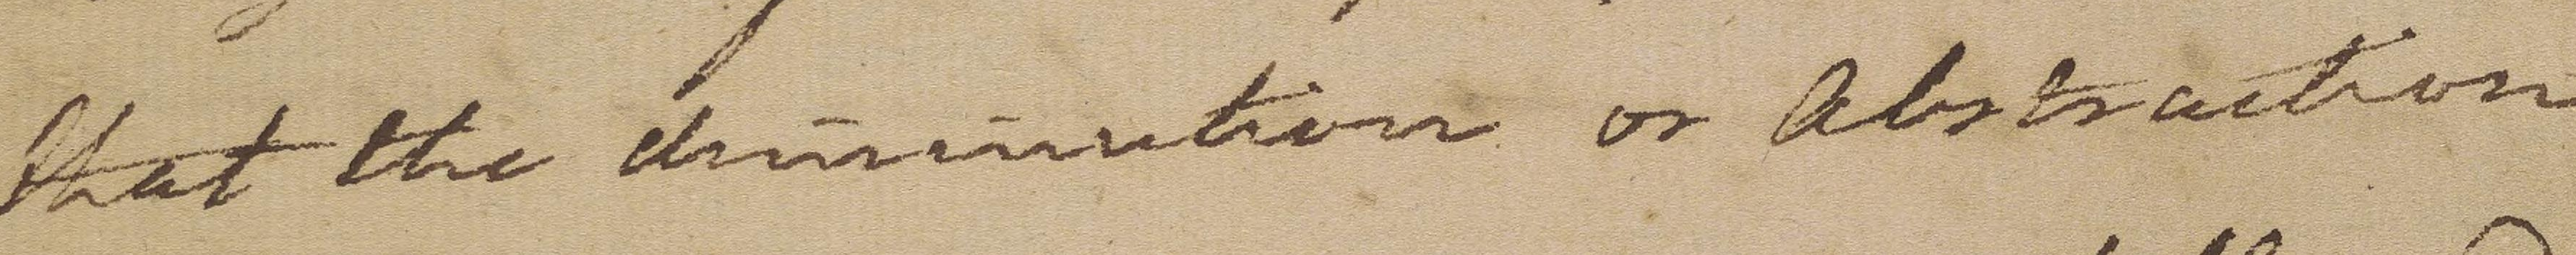that the diminuation or abstraction
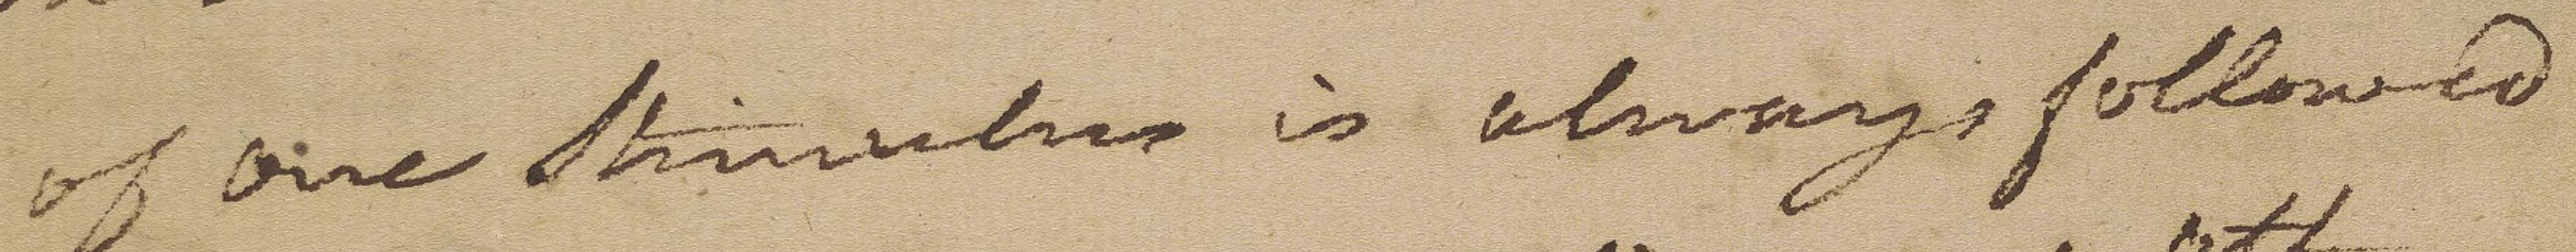of one Stimulus is always followed
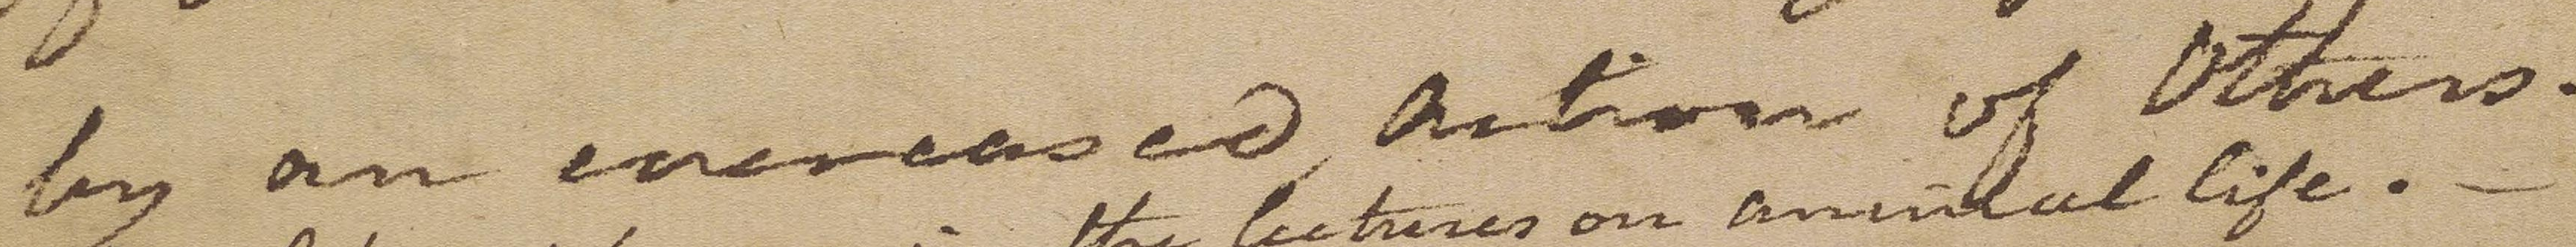by an encreased action of Others.
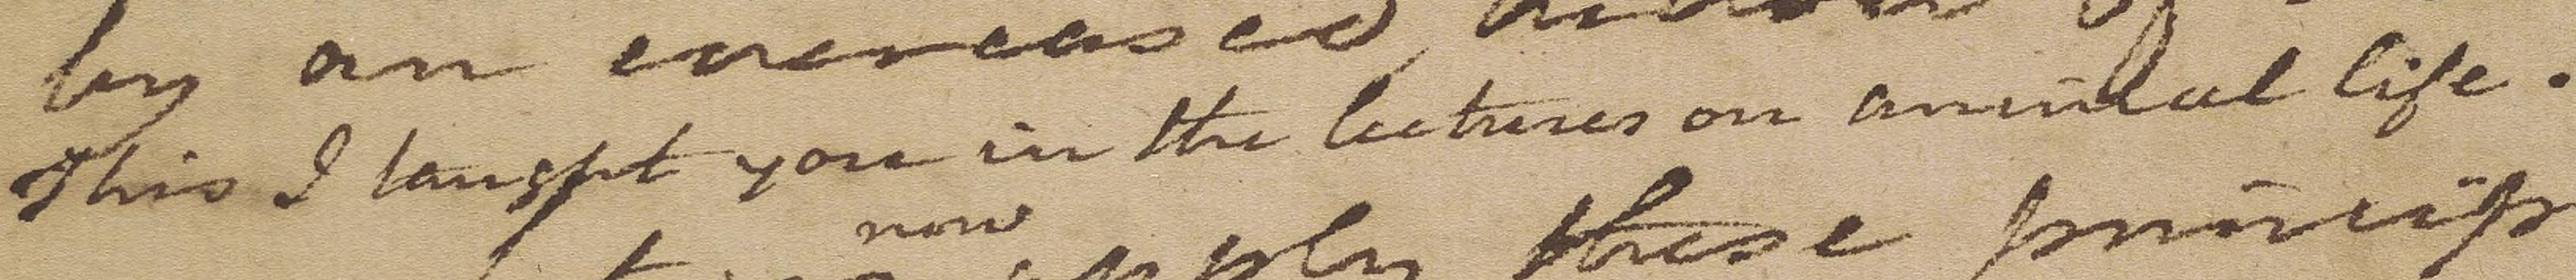This I taught you in lectures on animal life.
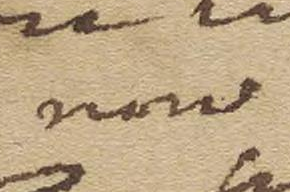now
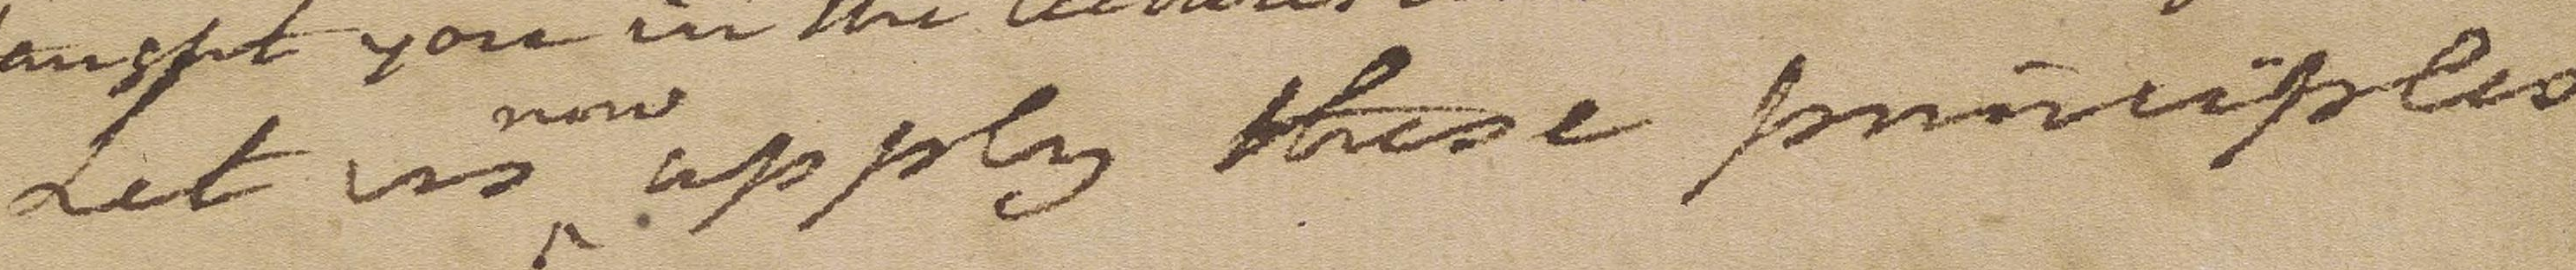Let us ^ apply these principles
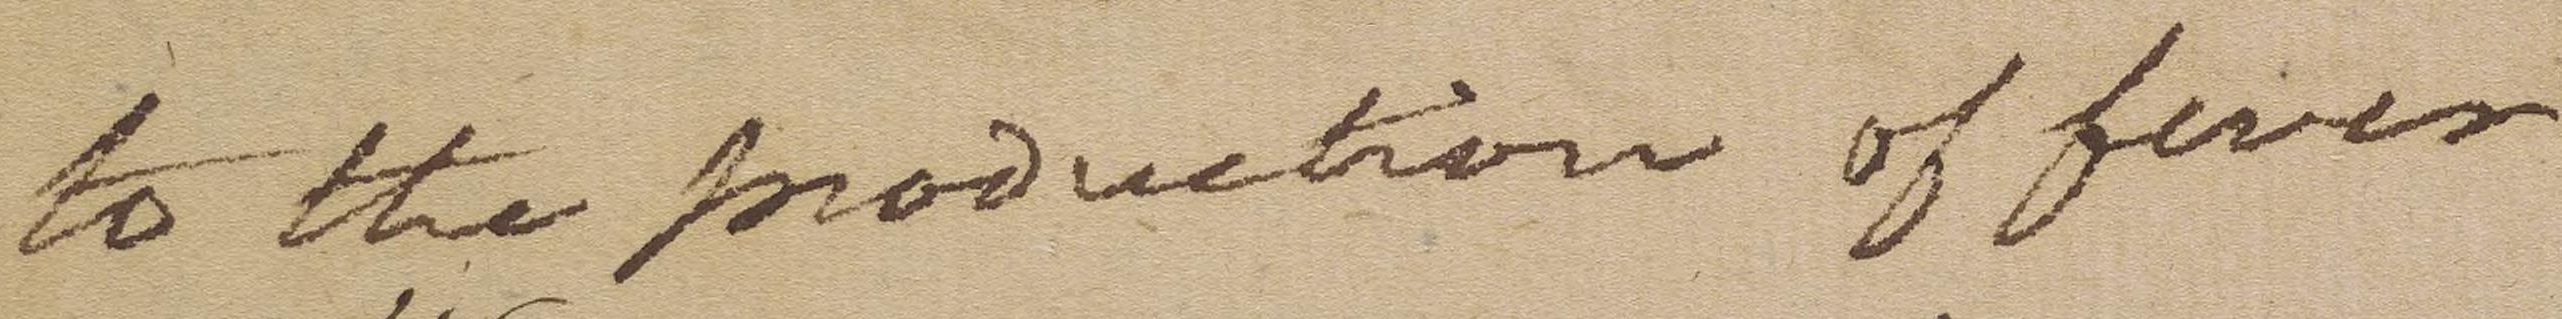to the production of fever
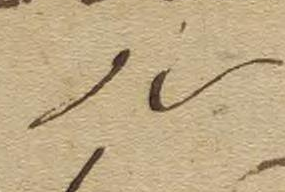IV
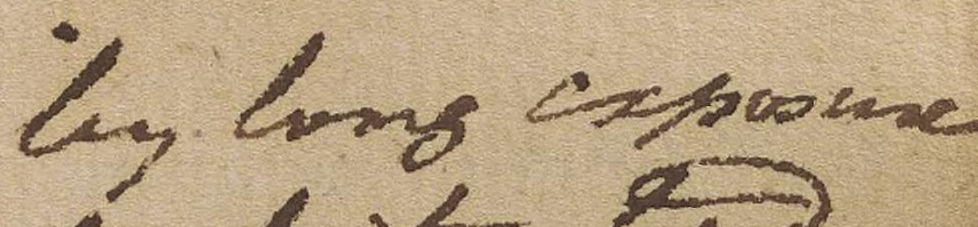by long exposure
